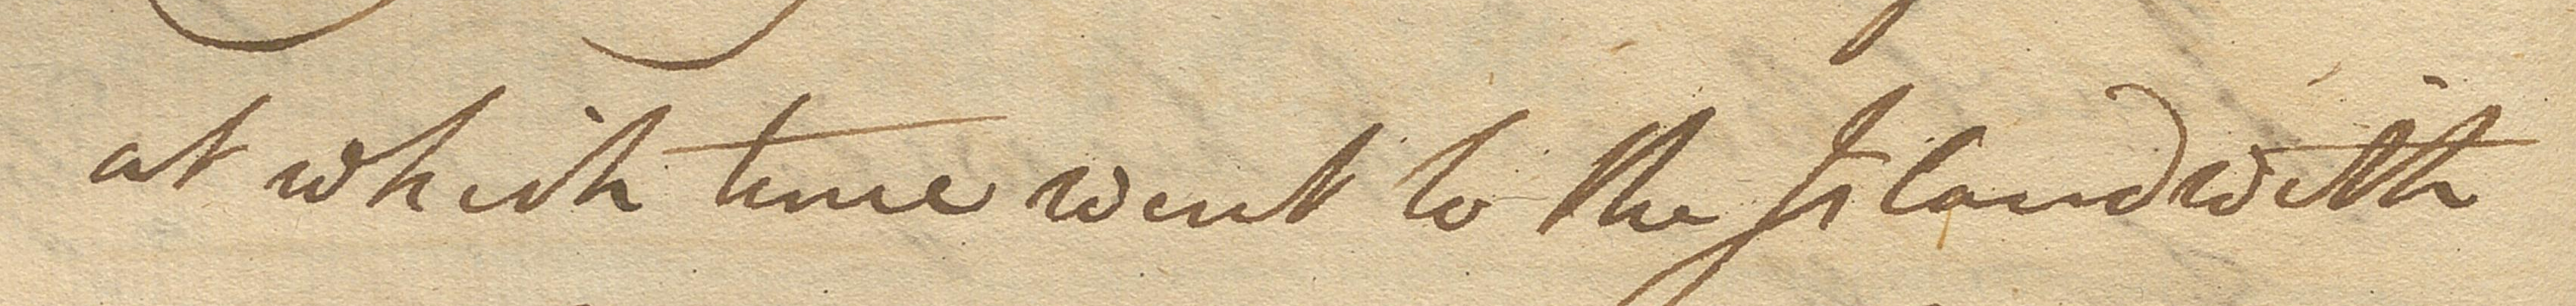at which time went to the Island with
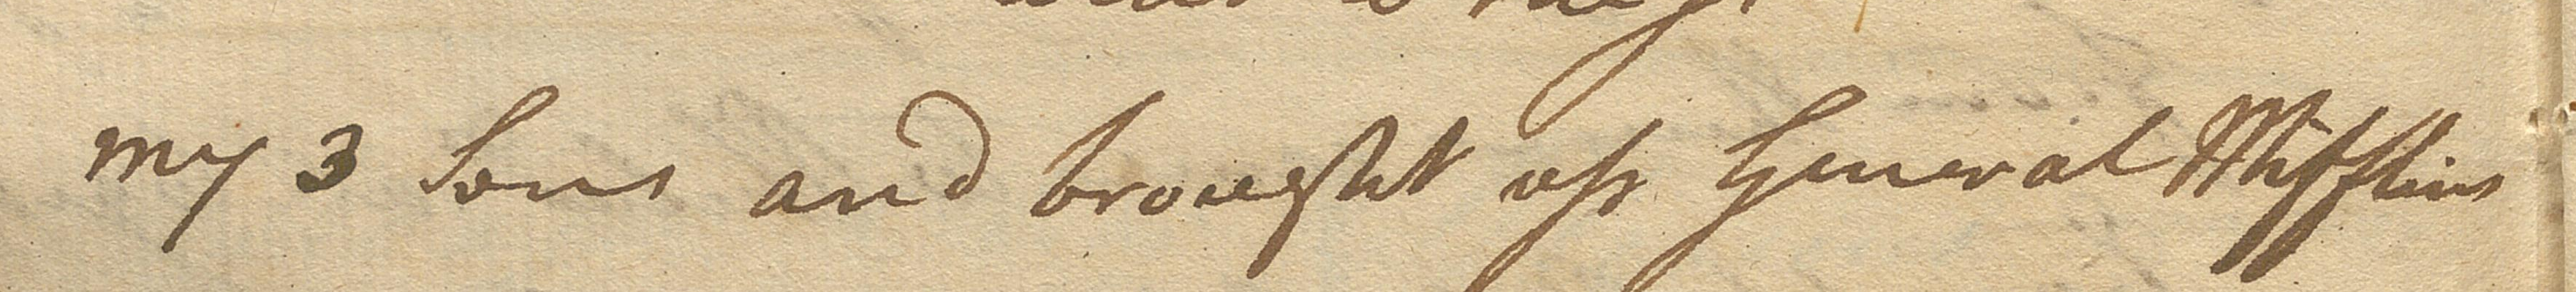my 3 Sons and brought up General Mifflins
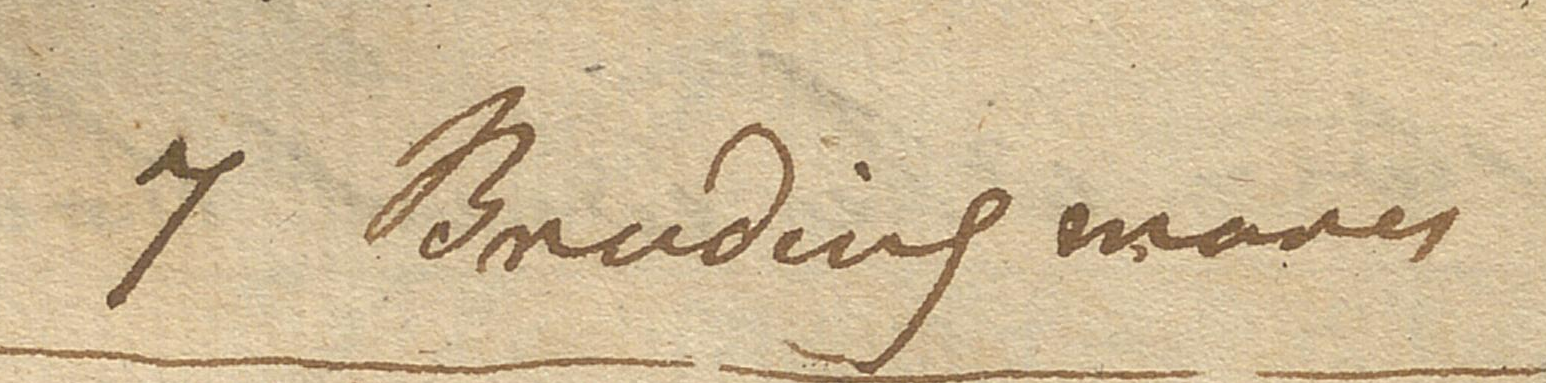7 Breeding mares
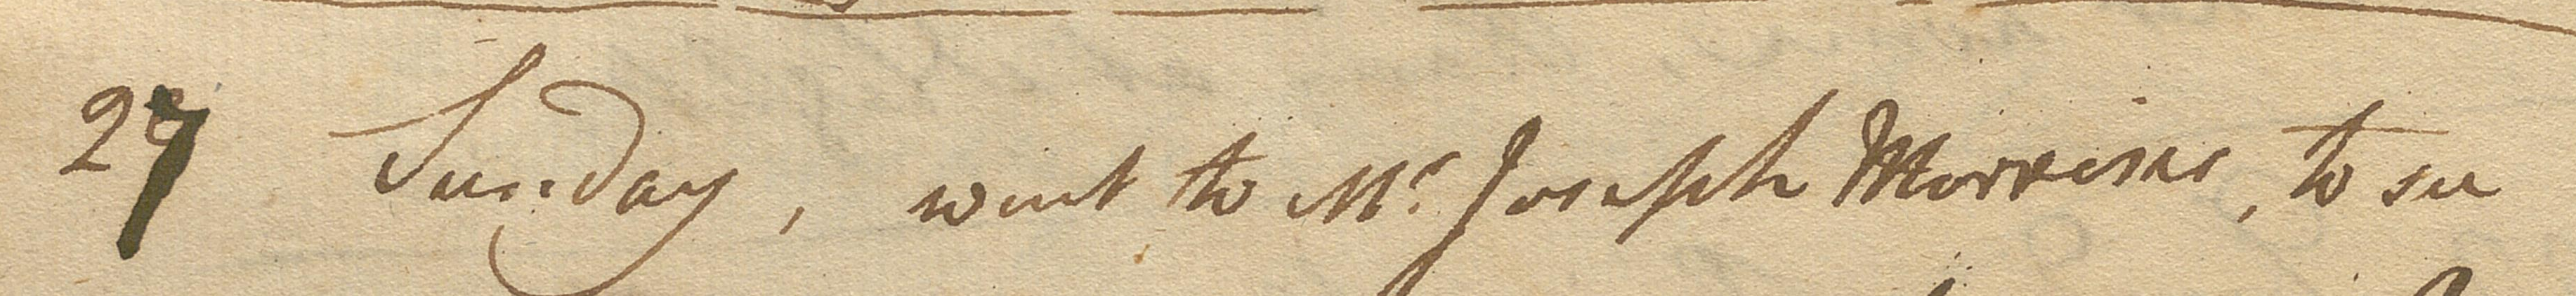27 Sunday, went to M^r. Joseph Morrises, to see
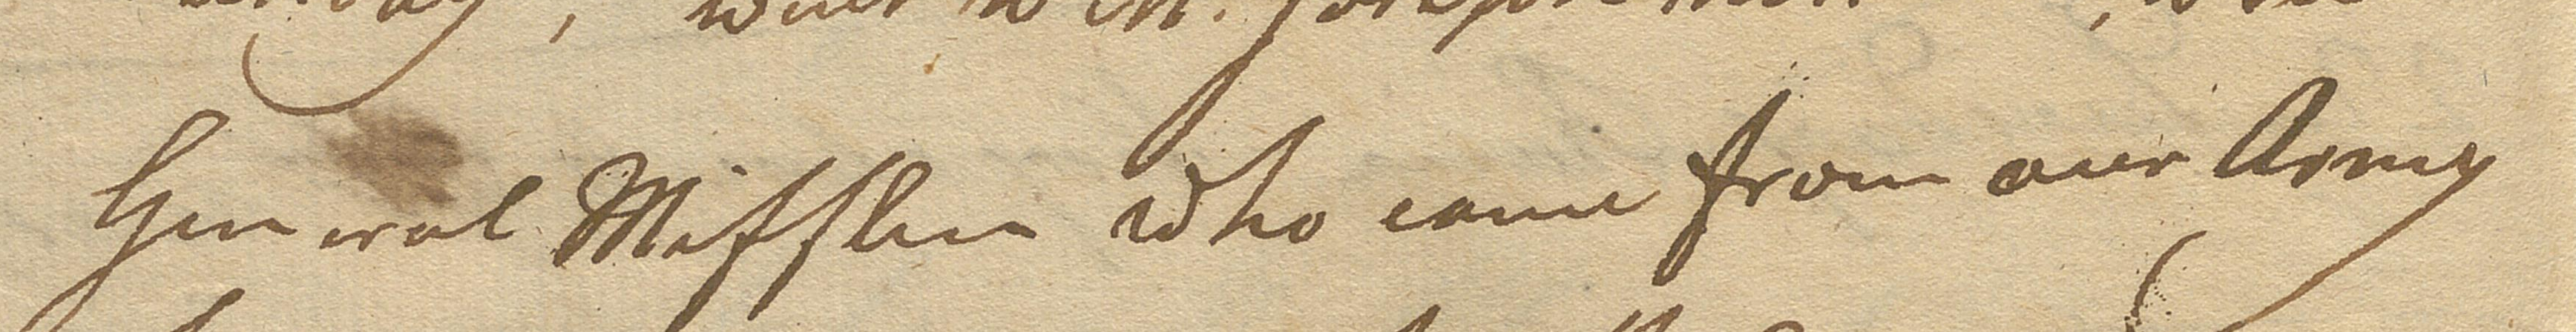General Mifflin who came from our Army
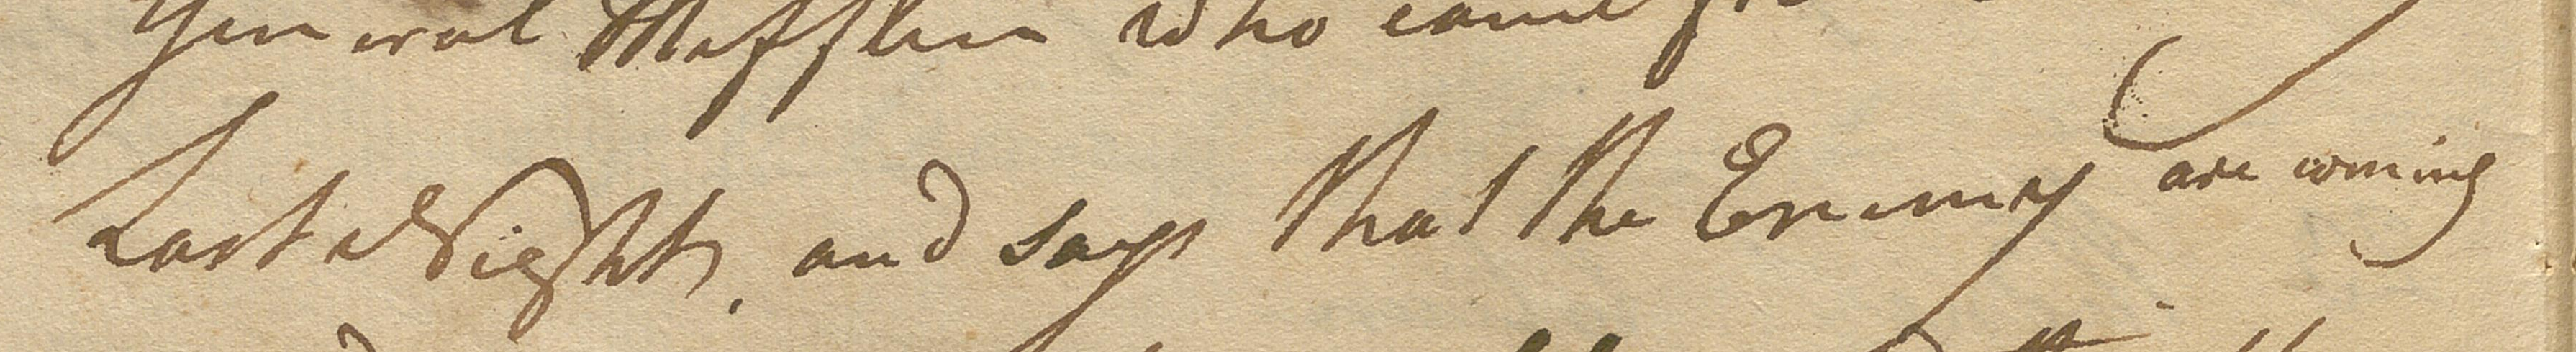Last Night and says that the Enemy are coming
